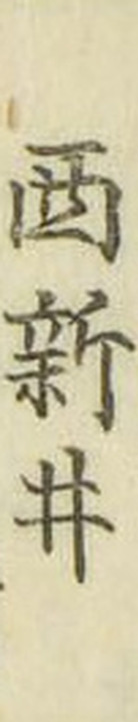西新井
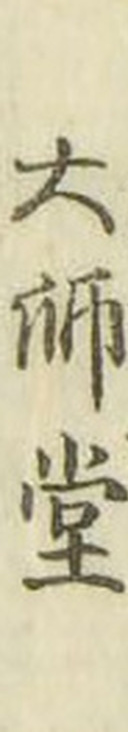大師堂
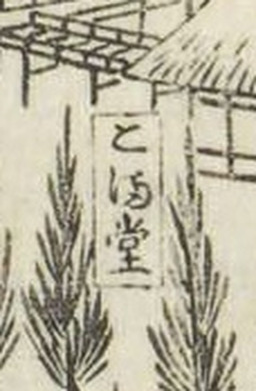こま堂
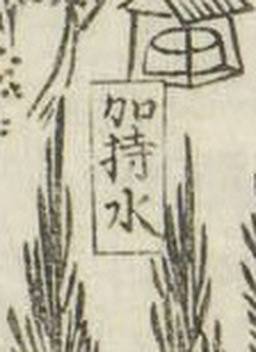加持水

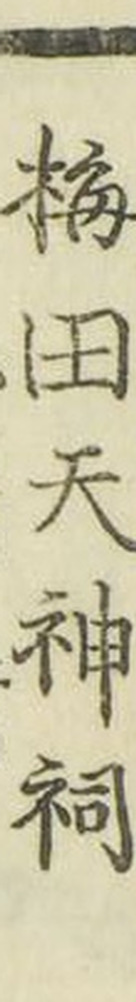梅田天神祠
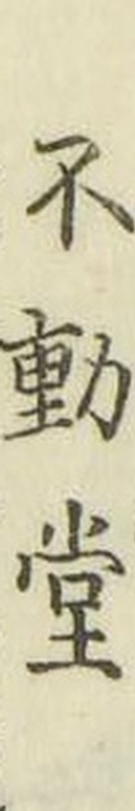不動堂
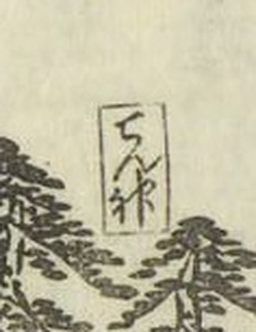てん神
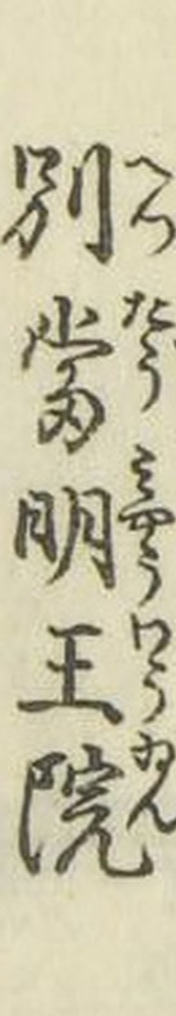別当明王院

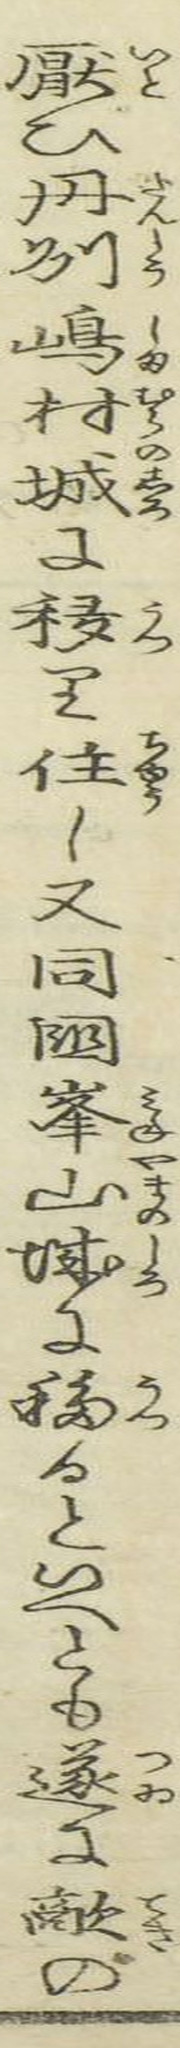厭ひ丹州島村城に移り住し又同国峯山城に移るといへとも遂に敵の
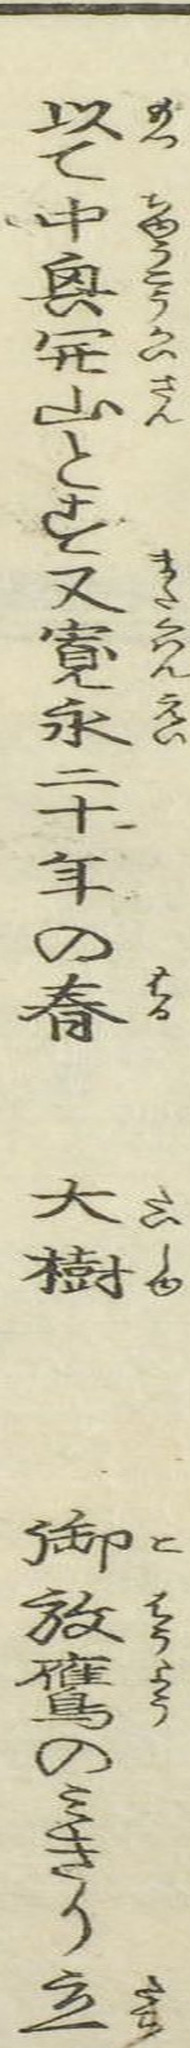以て中興開山とす又寛永二十年の春大樹御放鷹のみきり立
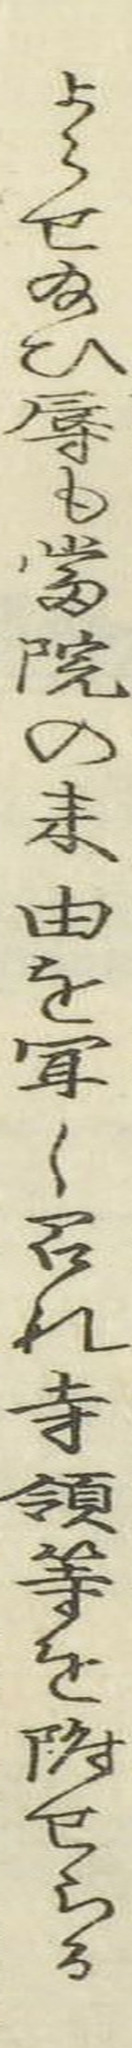よらせ給ひ辱も当院の来由を聞し召れ寺領等を附せらる
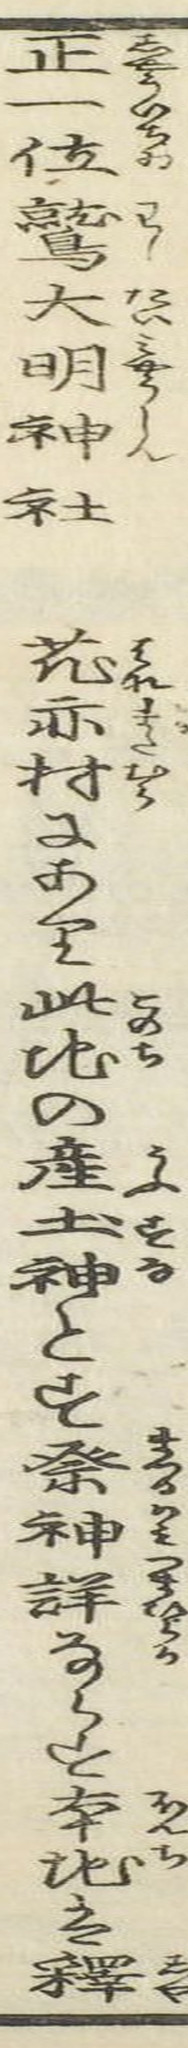正一位鷲大明神社花亦村にあり此地の産土神とす祭神詳ならす本地は釈
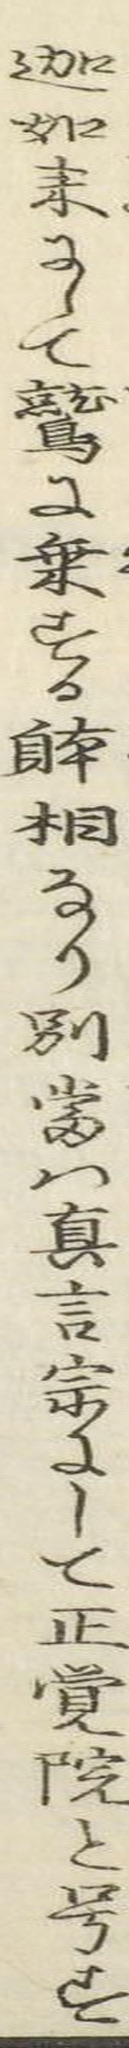迦如来にして鷲に乗する体相なり別当は真言宗にして正覚院と号す
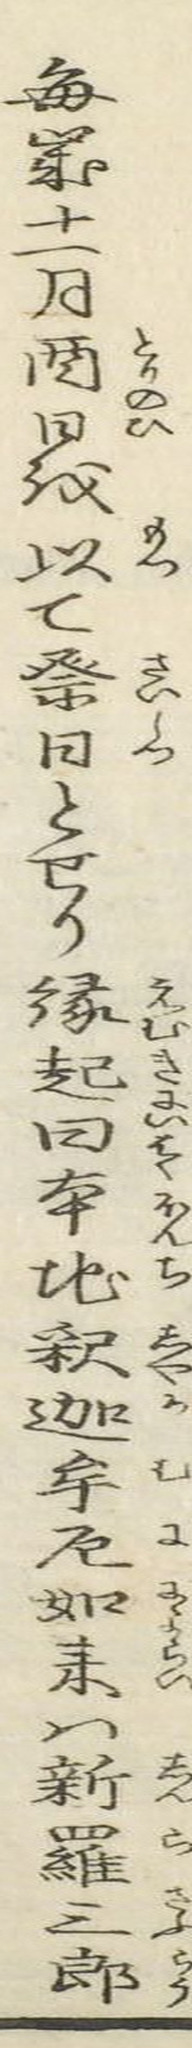毎歳十一月酉日を以て祭日とせり縁起曰本地釈迦牟尼如来は新羅三郎
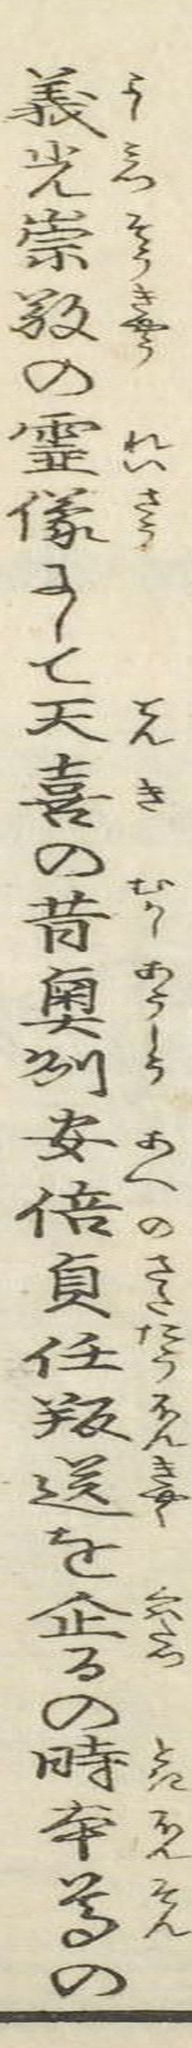義光崇教の霊像にして天喜の昔奥州安倍貞任叛逆を企るの時本尊の
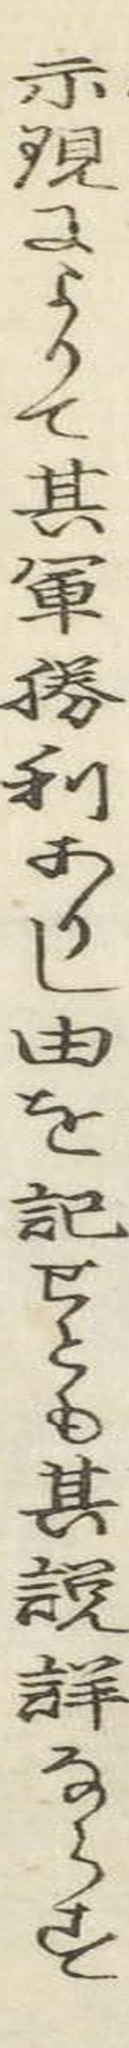示現によりて其軍勝利ありし由を記せとも其説詳ならす
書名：江戸名所図会 20巻 巻之17
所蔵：東京学芸大学教育コンテンツアーカイブ
